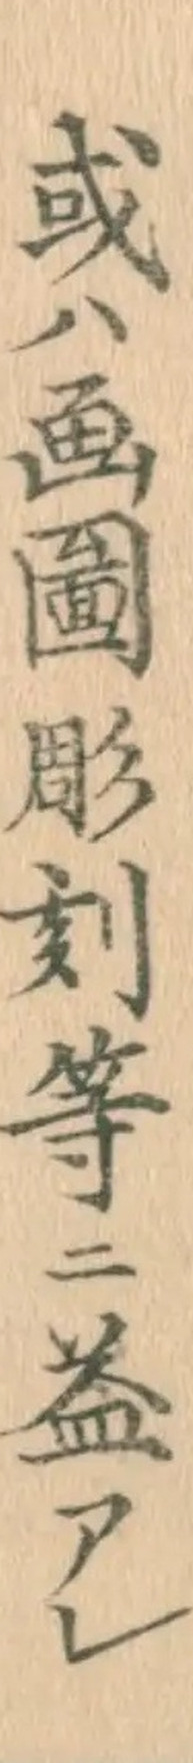或ハ画図彫刻等ニ益アレ
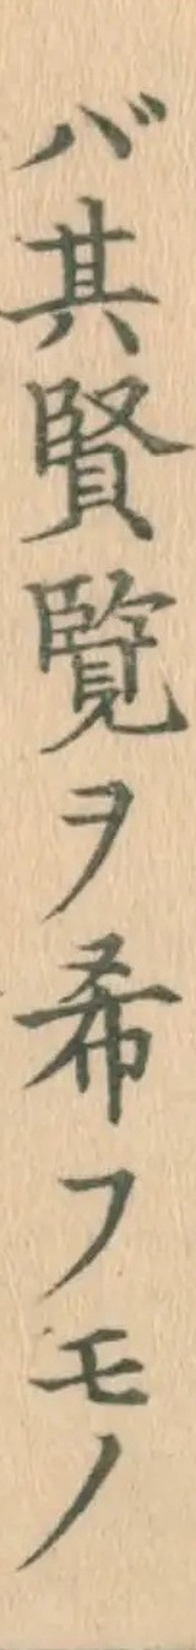バ其賢覧ヲ希フモノ
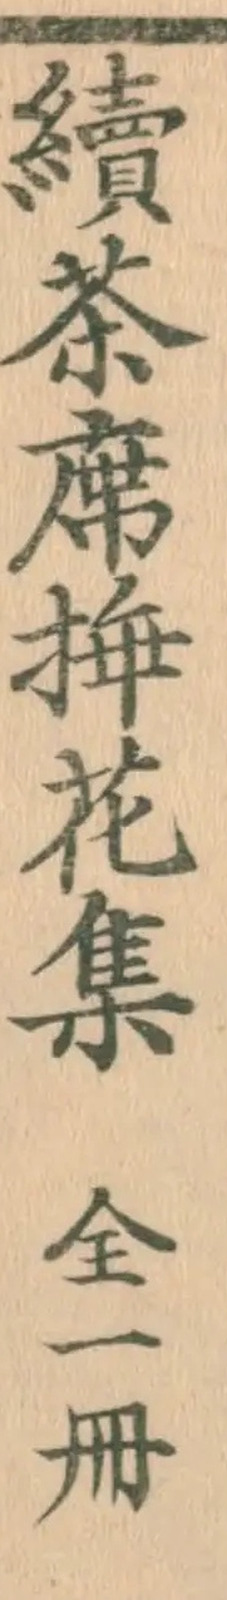続茶席挿花集全一冊
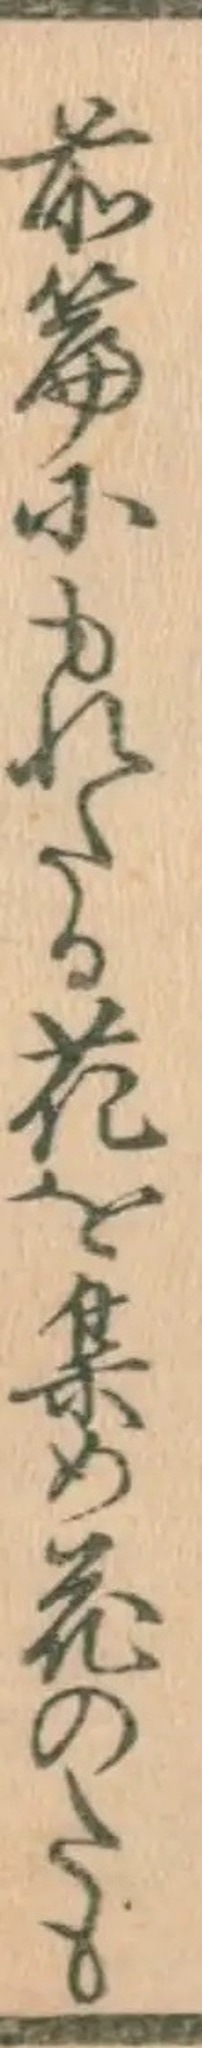前篇にもれたる花を集め花のたも
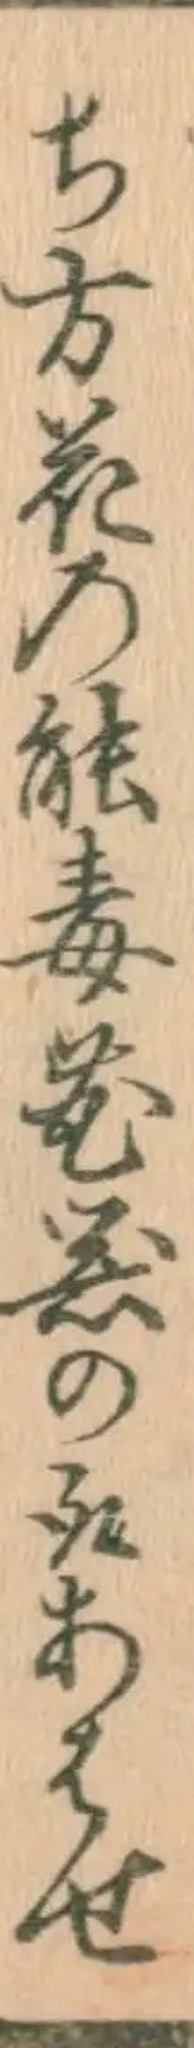ち方花の能毒花器の取あはせ
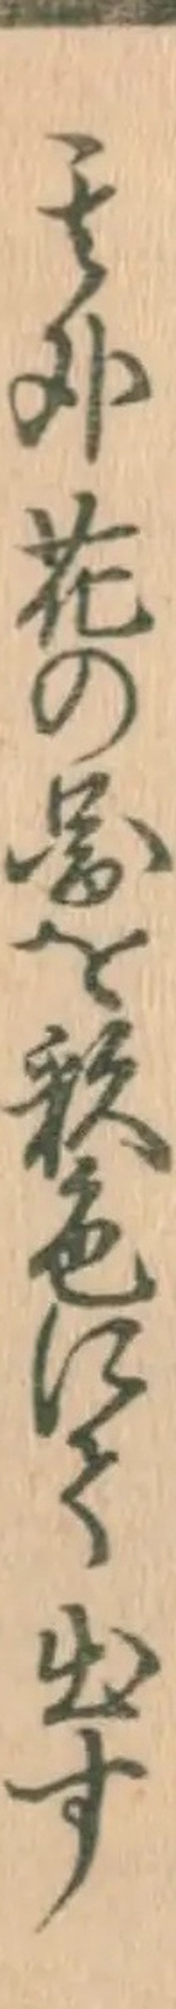其外花の図を彩色にて出す
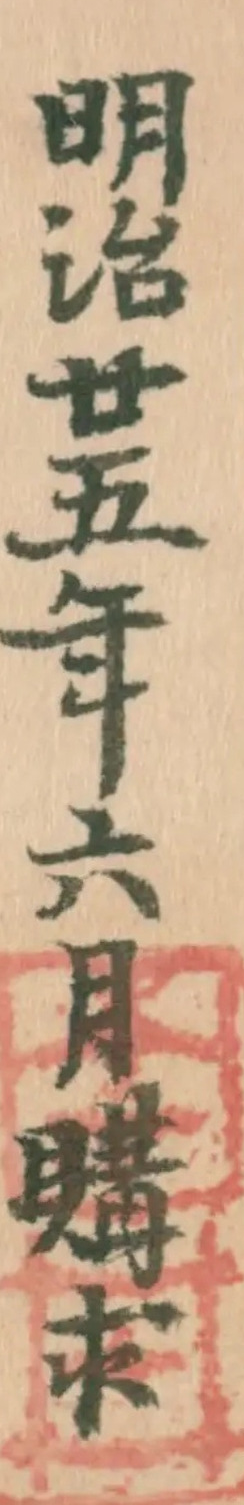明治廿五年六月購求
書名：茶席挿花集
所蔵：国立国会図書館 National Diet Library, JAPAN
